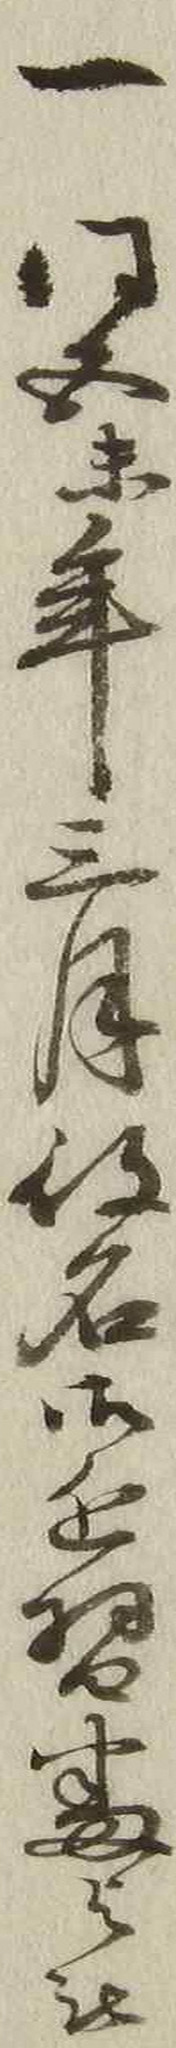一同五未年三月役名御近習番与被
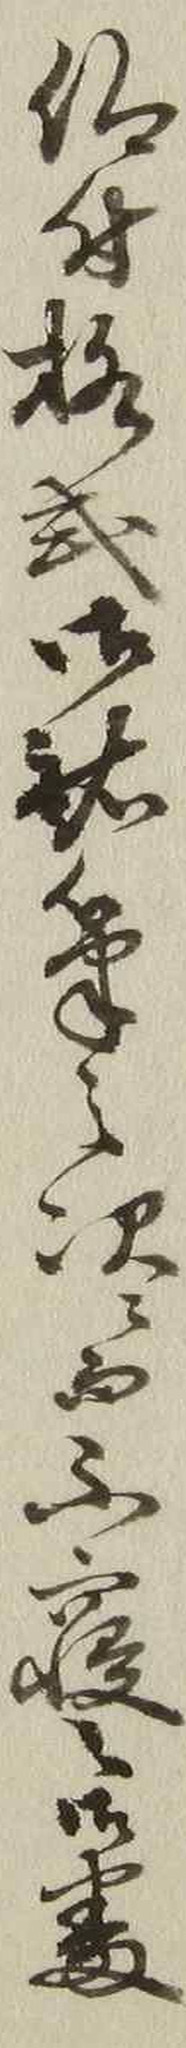仰付格式御祐筆之次ニ而不寝之御番
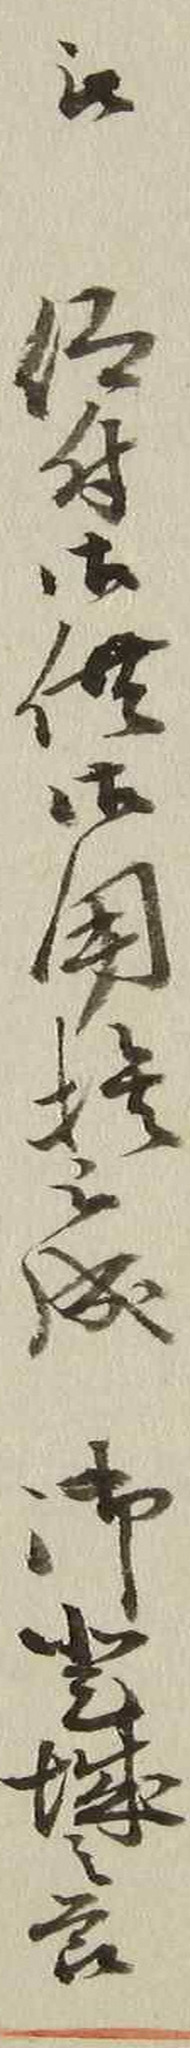被仰付御供御用捨被成御登城之節
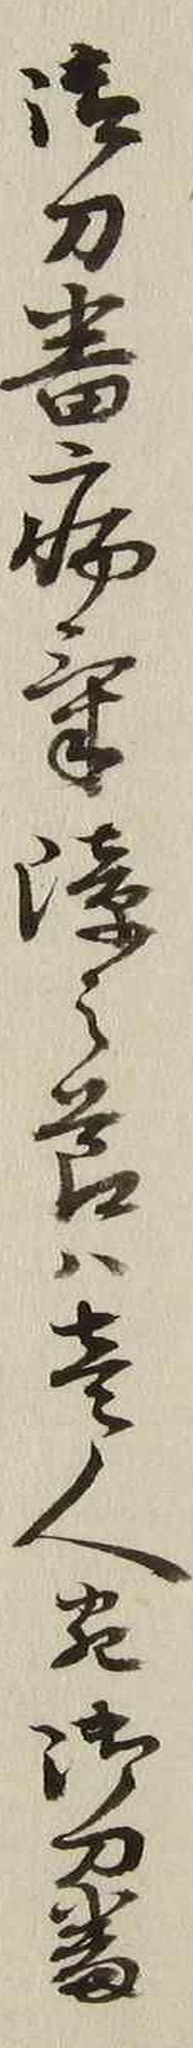御刀番病気障之節ハ壱人宛御刀番
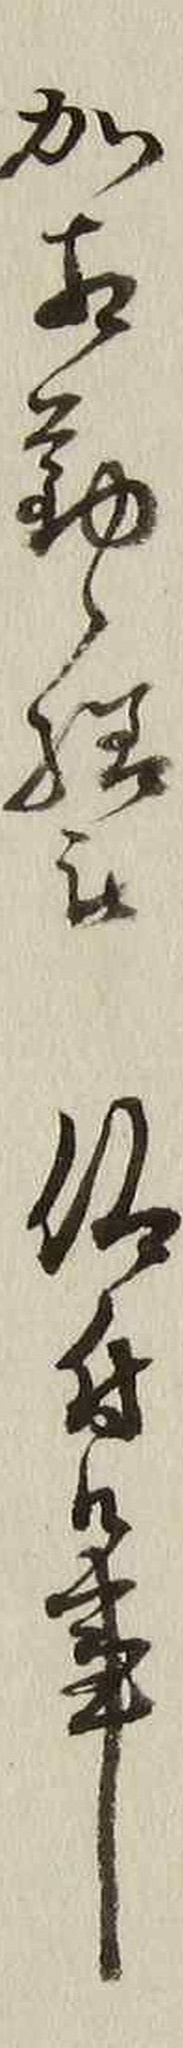加相勤候様被仰付候事
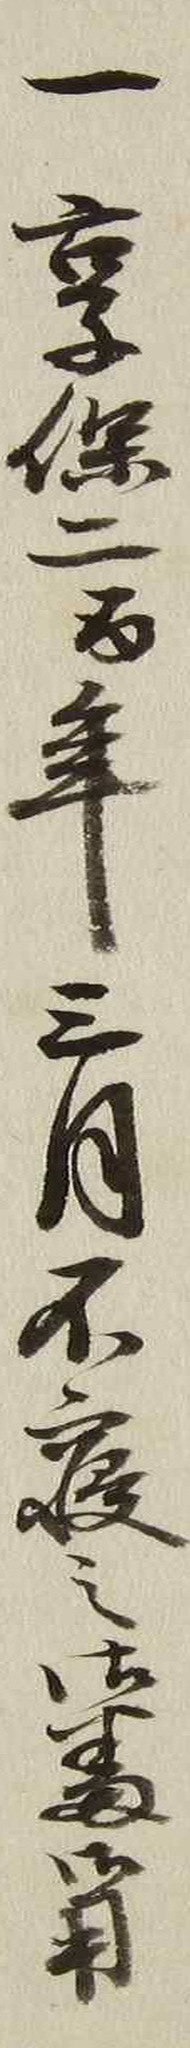一享保二酉年三月不寝之御番御用
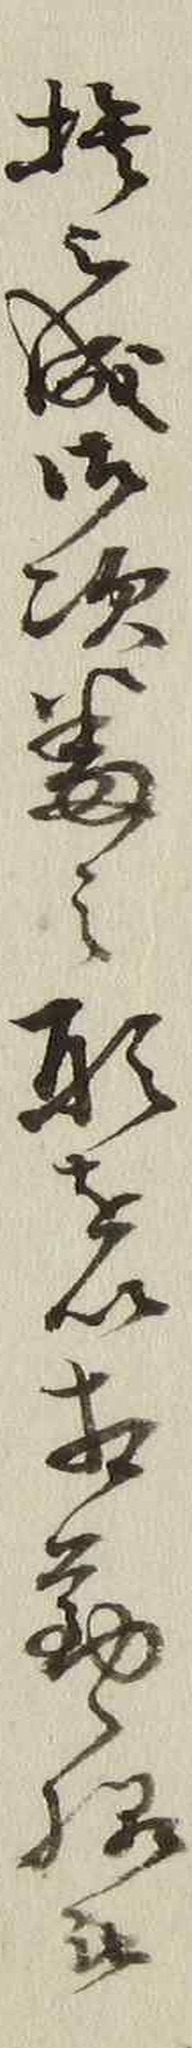捨被成御次番之形を以相勤候様被
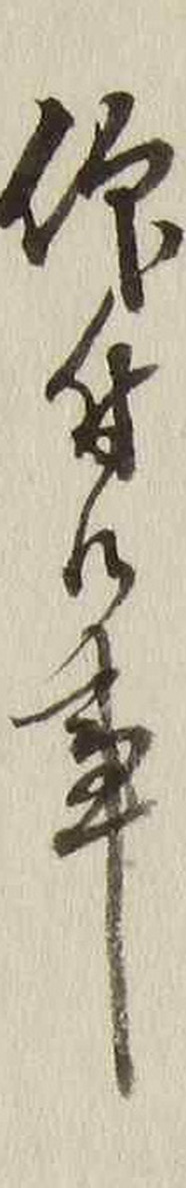仰付候事
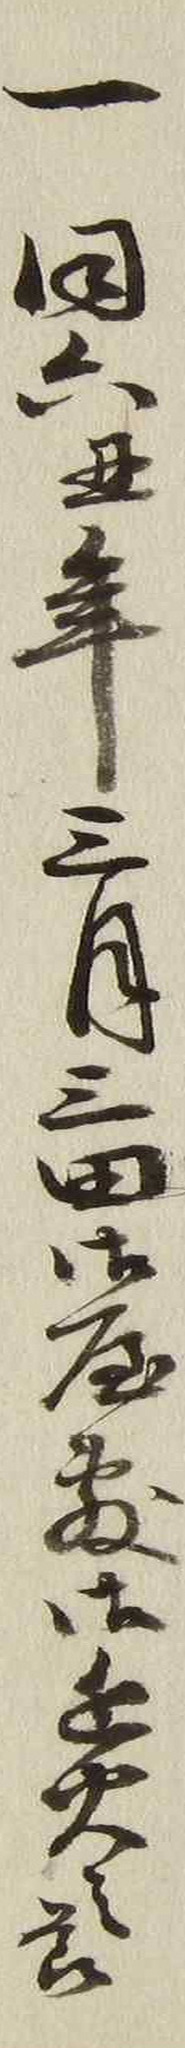一同六丑年三月三田御屋敷御近火之節
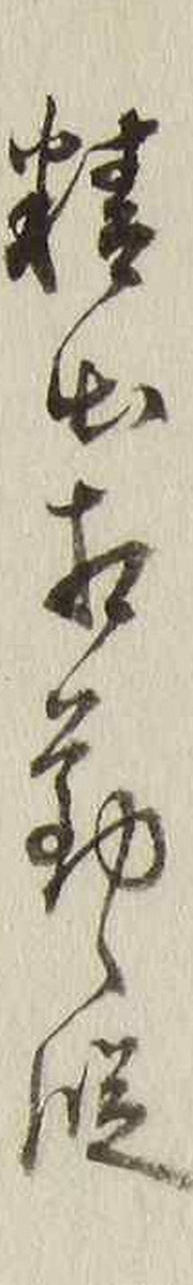精出相勤候段
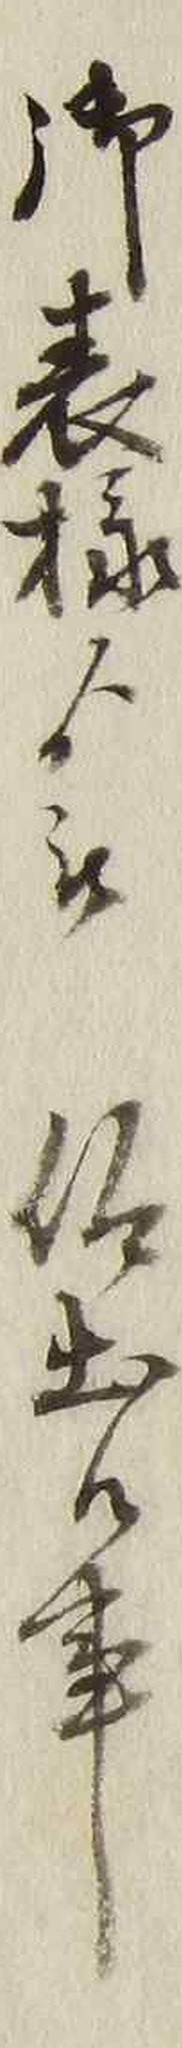御表様ゟ被仰出候事
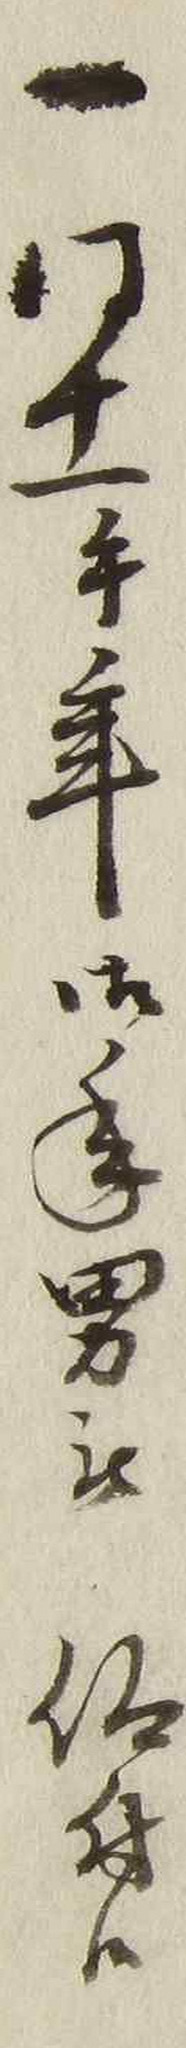一同十一午年御年男被仰付候
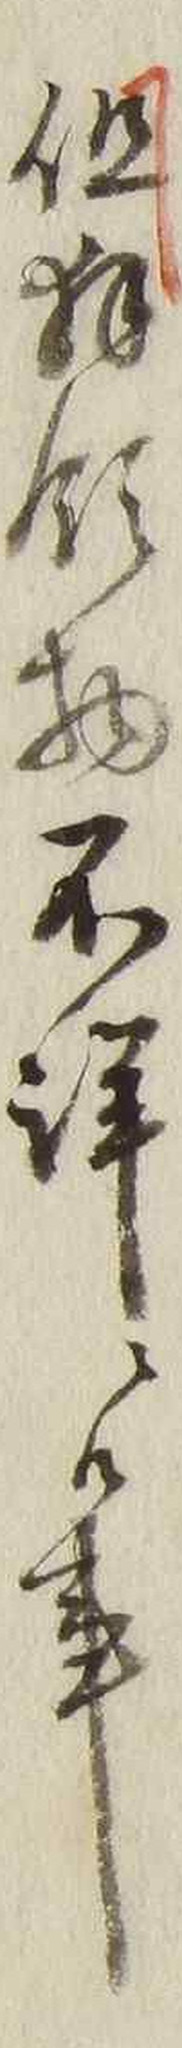但拝領物不詳ニ候事

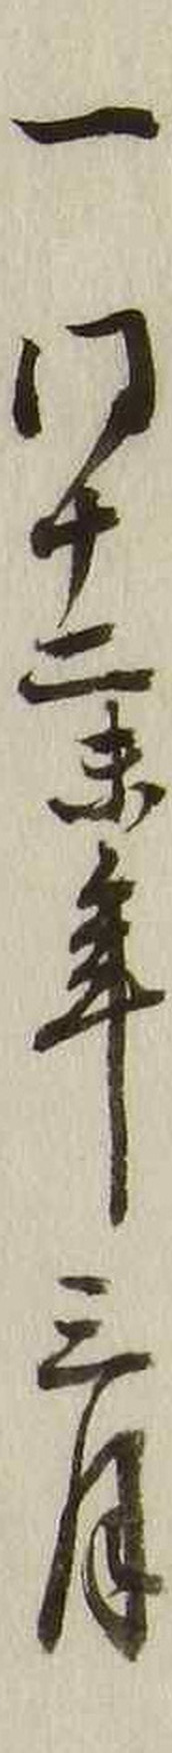一同十二未年三月
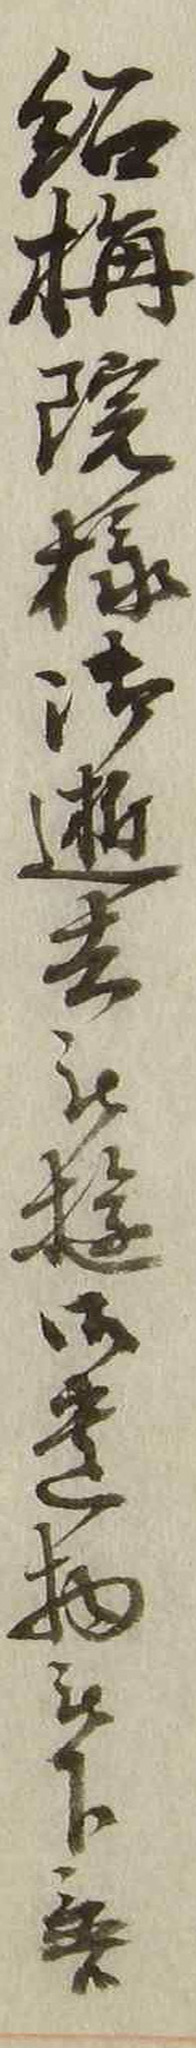紹栴院様御逝去被遊御遺物被下置候
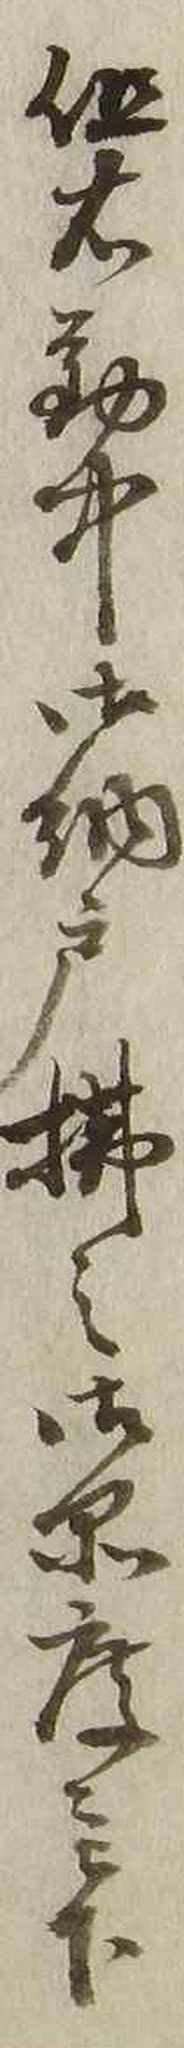但右勤中御納戸払之御品度々被下
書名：諸士系譜　巻之27　い之部27
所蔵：会津若松市立会津図書館
